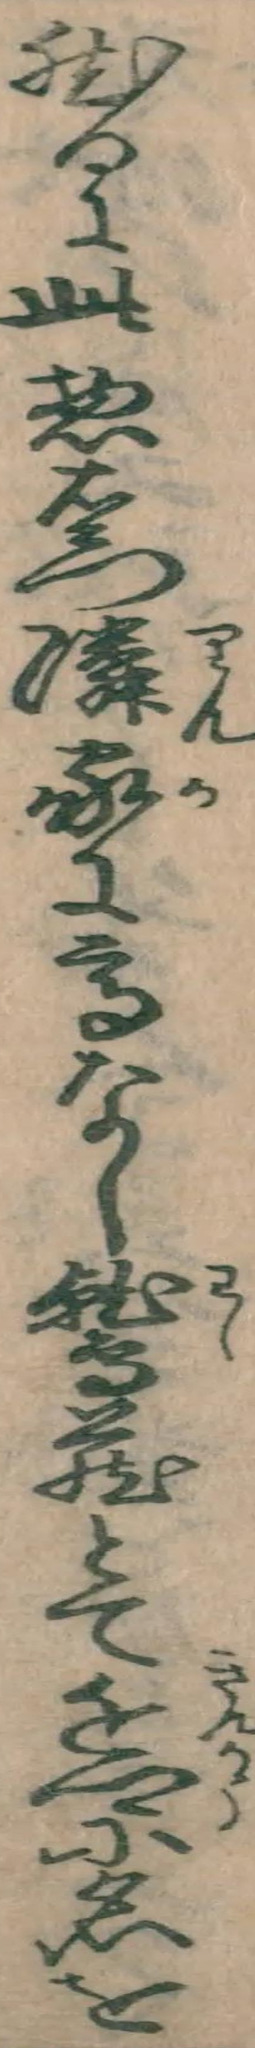然るに此惣右衛門隣家に高なし鷲蔵とて近郷に名を
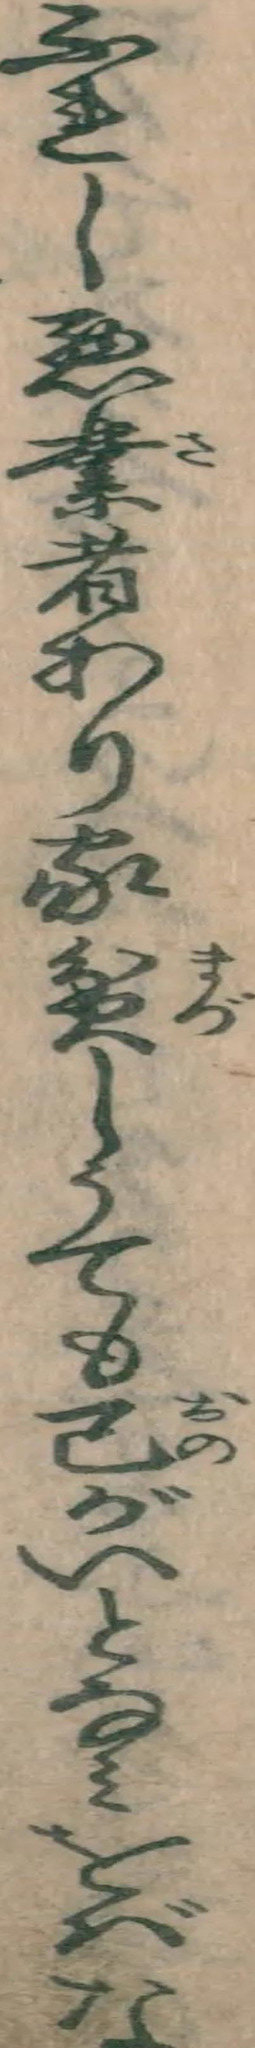ふれし悪業者あり家貧しうても己がいとなみをばな
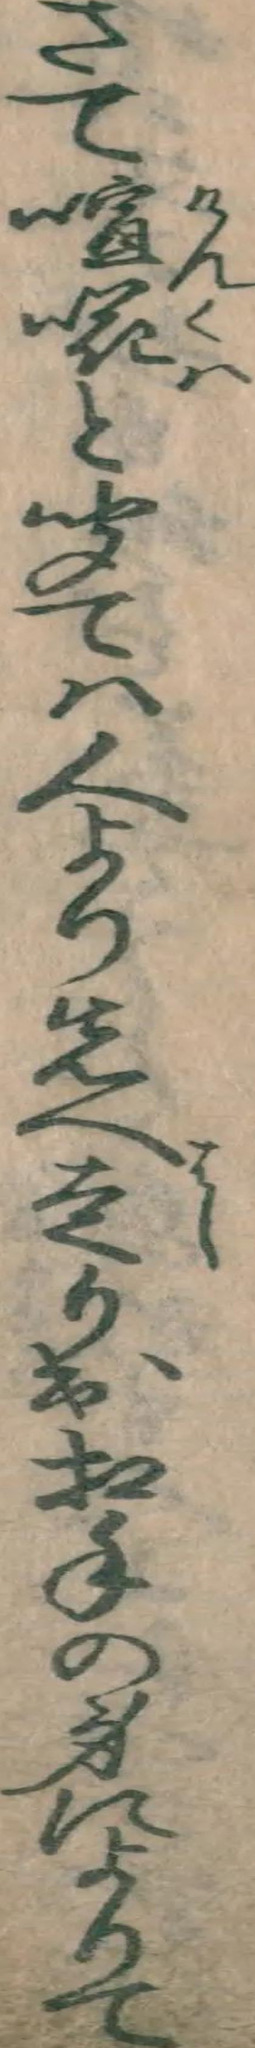さて喧嘩と聞ては人より先へ走り出相手の身によりて
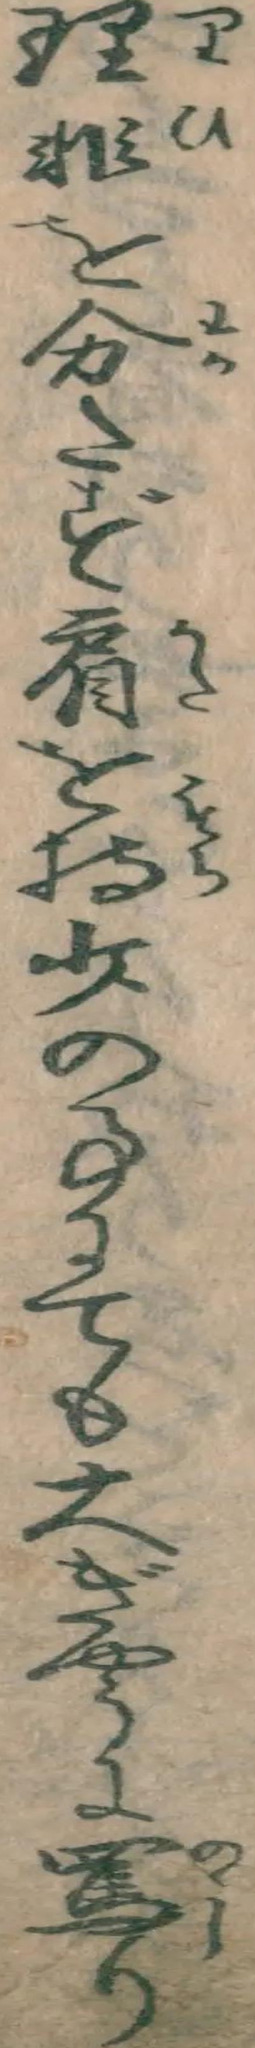理非を分たず肩を持少の事にても大ぎやうに罵り
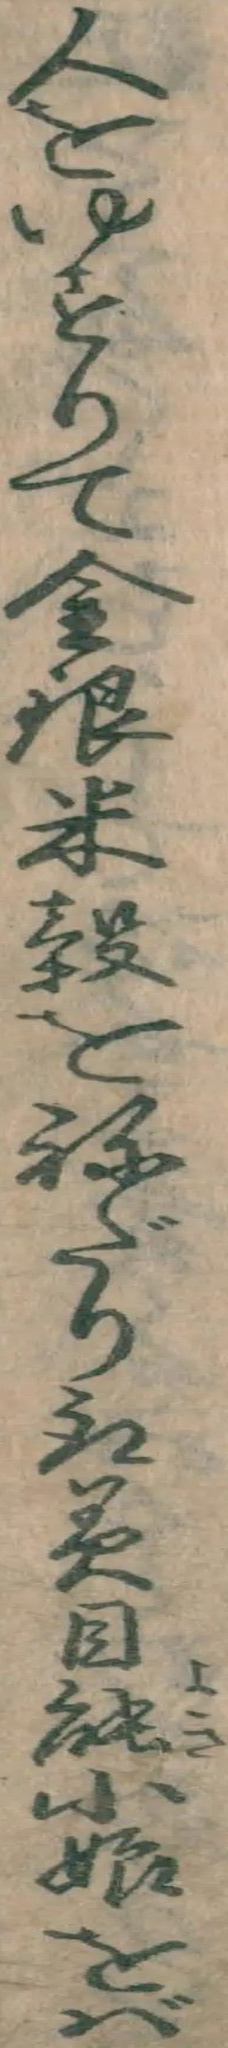人をゆすりて金銀米穀をねだり取美目能小娘をば

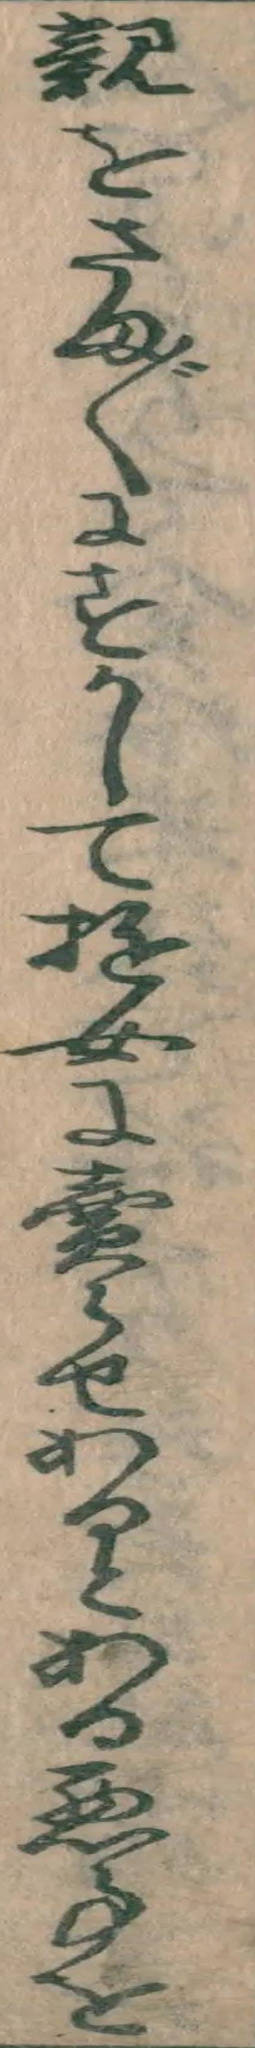親をさま〴〵にすかして遊女に売らせあるとある悪事を
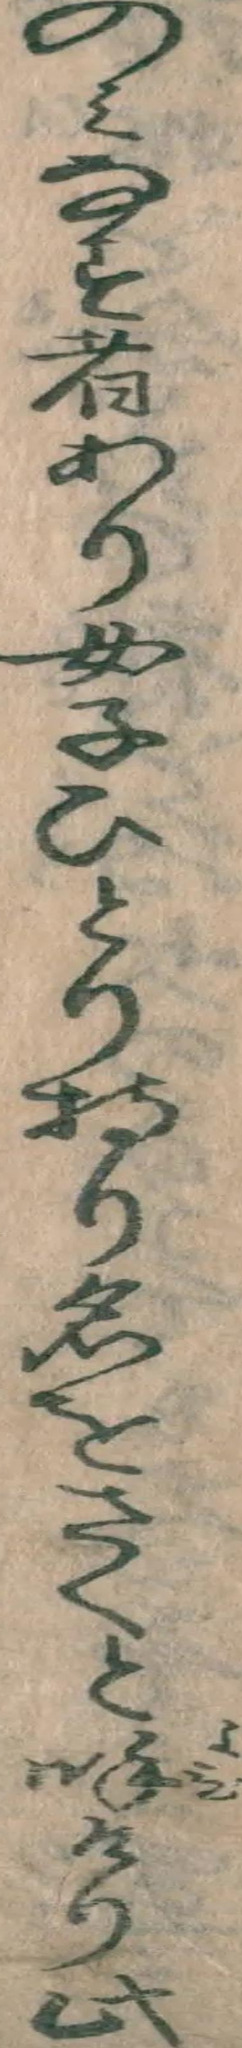のみなす者あり女子ひとり持り名をさくと呼けり此
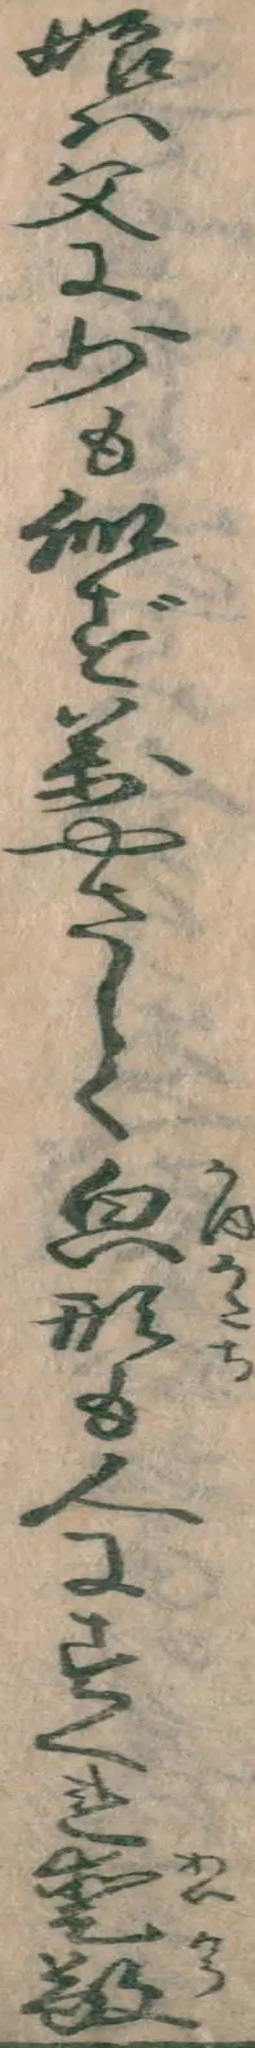娘は父に少も似ず万やさしく貌形も人にすくれ愛嬌
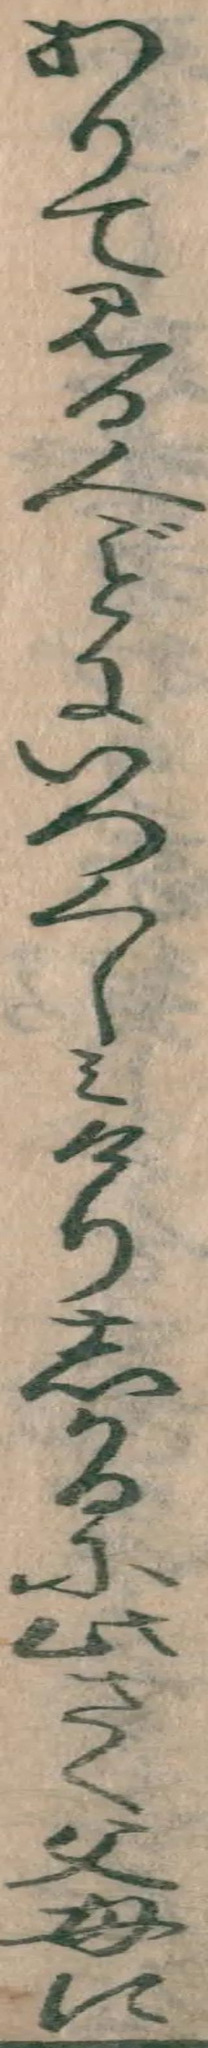ありて見る人ごとにいつくしみけりしかるに此さく父母に
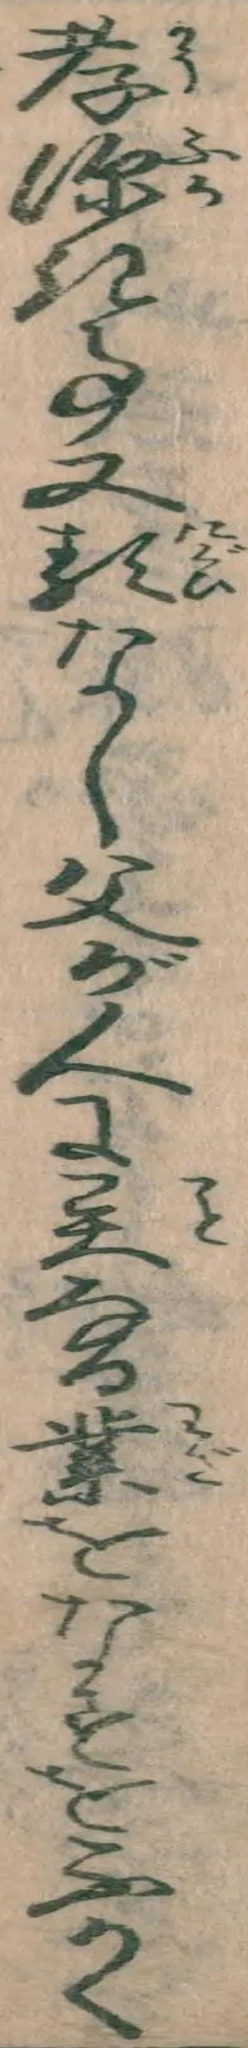孝深き事又類なし父が人に異なる業をなすをふかく
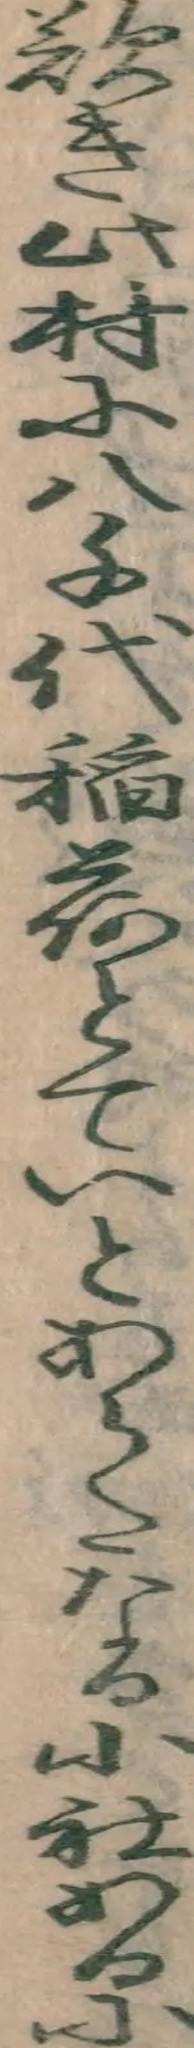歎き此村に八千代稲荷とていとあらたなる小社あるに
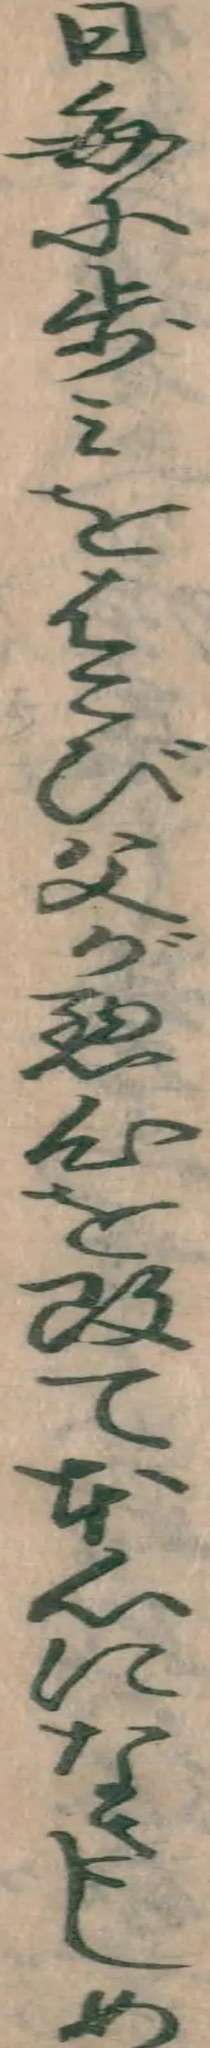日毎に歩みをはこび父が悪心を改て本心になさしめ
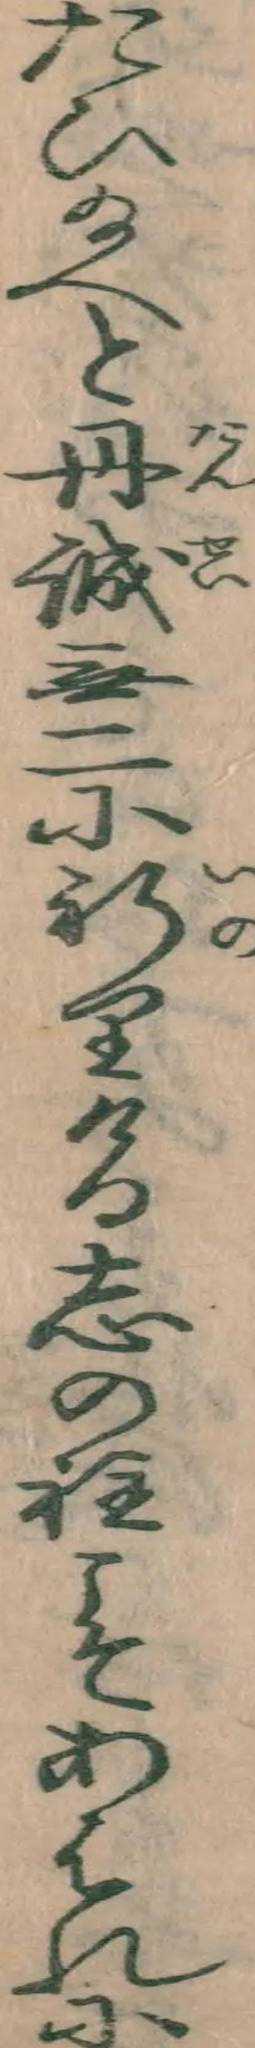たひ給へと丹誠無二に祈りける志の程こそあはれに
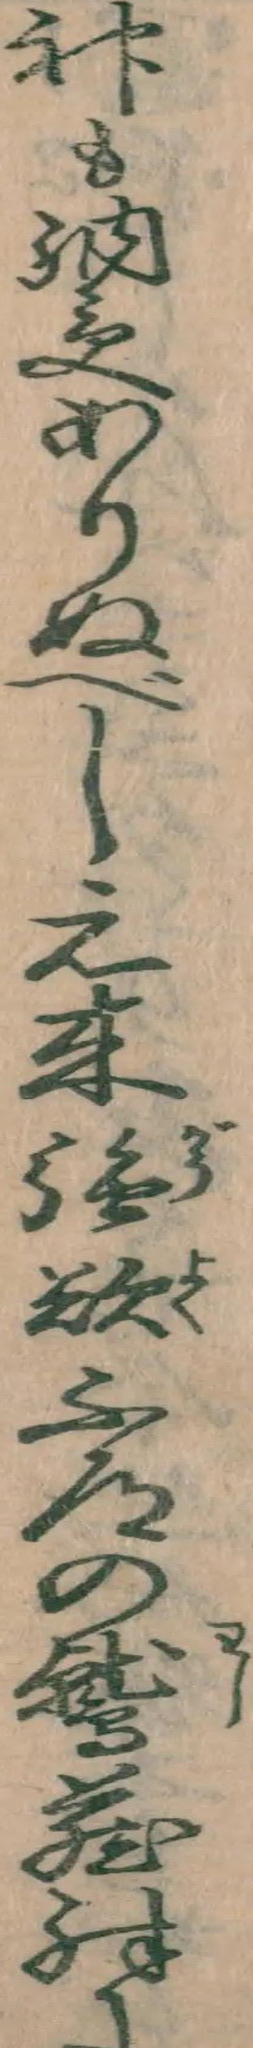神も納受ありぬべし元来強欲不動の鷲蔵殊に
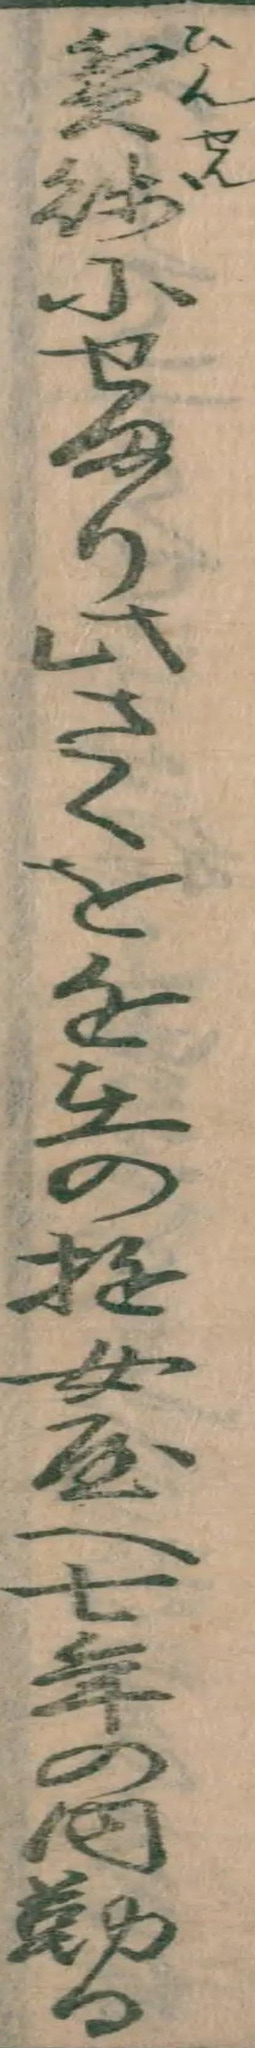貧賎にせまり此さくを在の遊女屋へ七年の内勤る
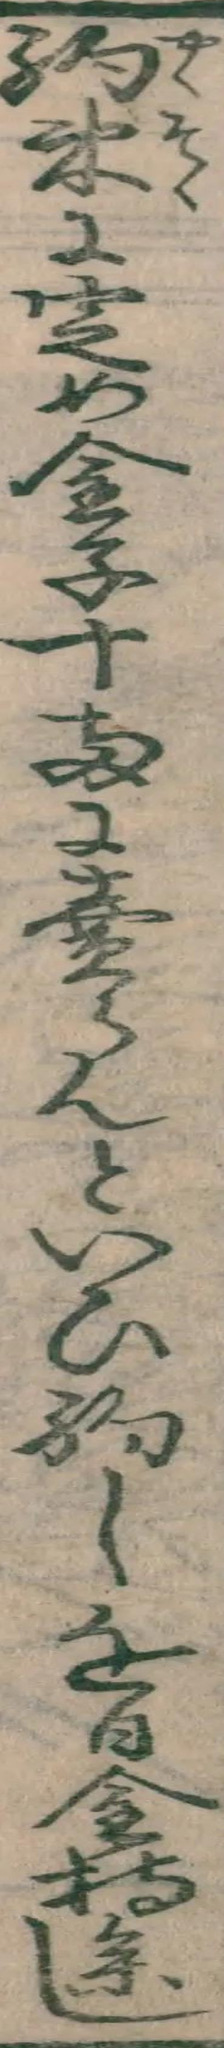約束に定め金子十両に売らんといひ約し近日金持参し
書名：怪談御伽童 5巻. [1]
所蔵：国立国会図書館 National Diet Library, JAPAN
